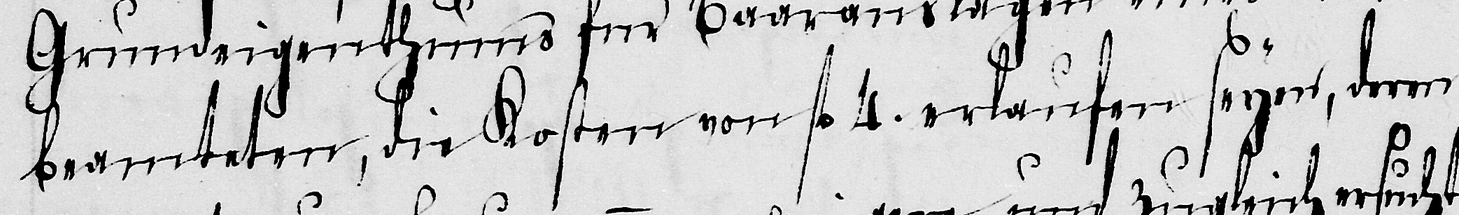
beamteten, die Kosten von fl. 4. erlaufen seyen, deren
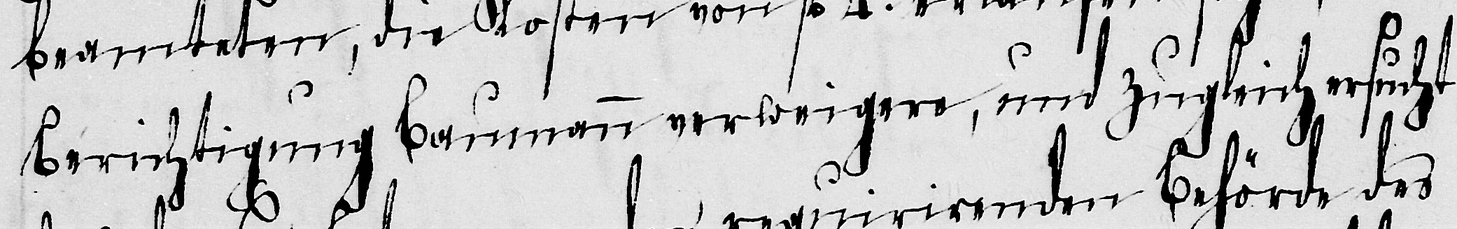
Berichtigung Baumann verweigere, und zugleich ersucht,
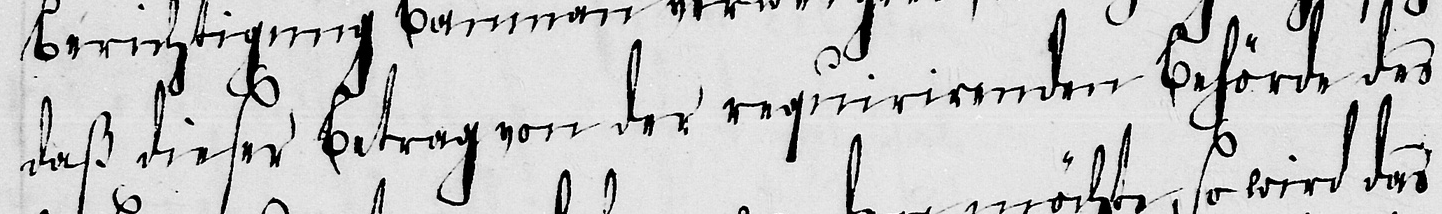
daß dieser Betrag von der requirirenden Behörde des
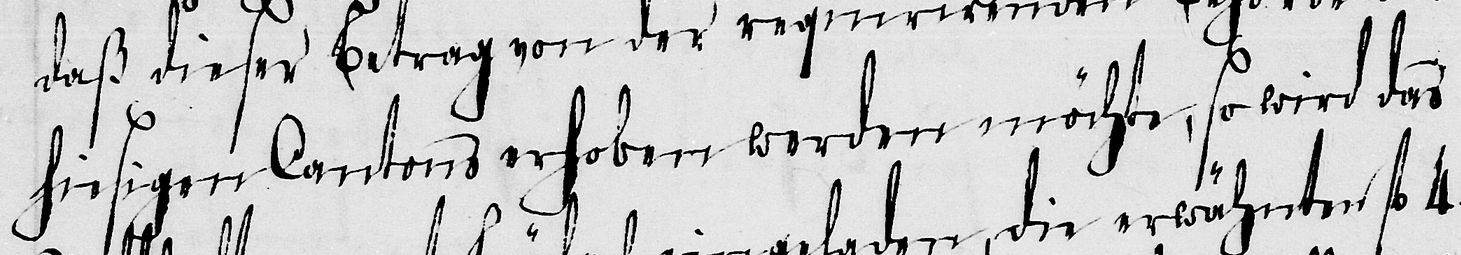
hiesigen Cantons erhoben werden möchte, so wird das
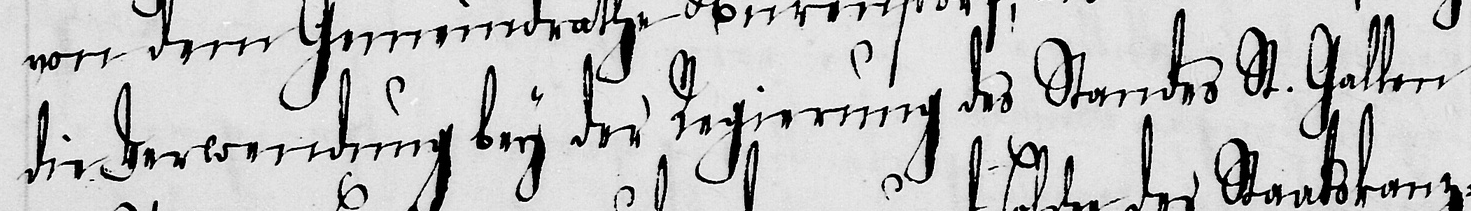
die Verwendung bey der Regierung des Standes St.Gallen
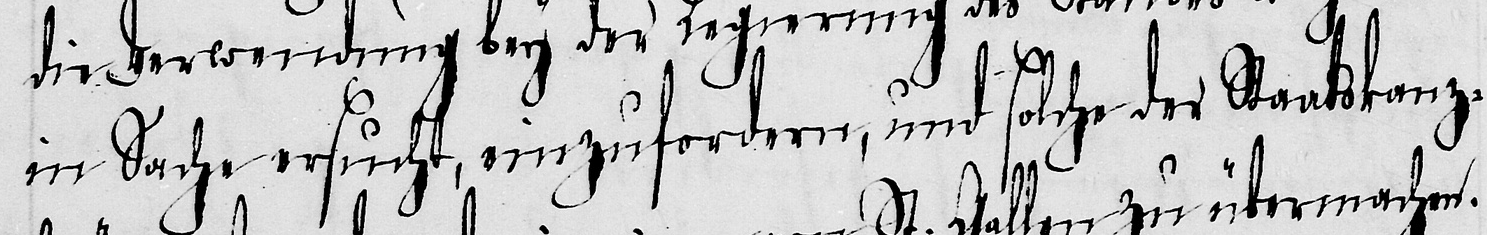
in Sache ersucht, einzufordern, und solche der Staatskanz¬
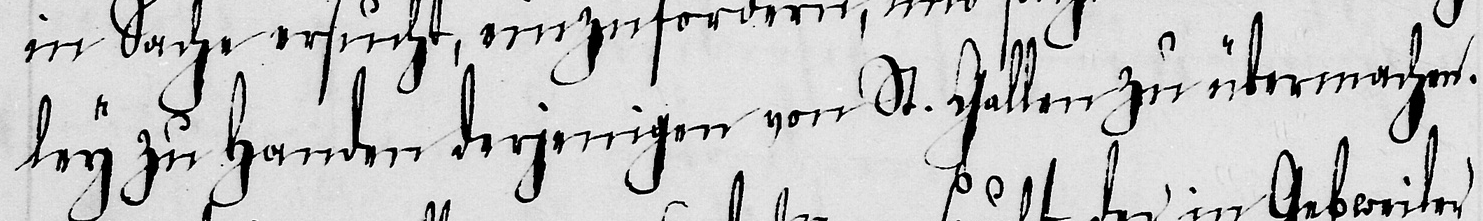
ley zu Handen derjenigen von St.Gallen zu übermachen.
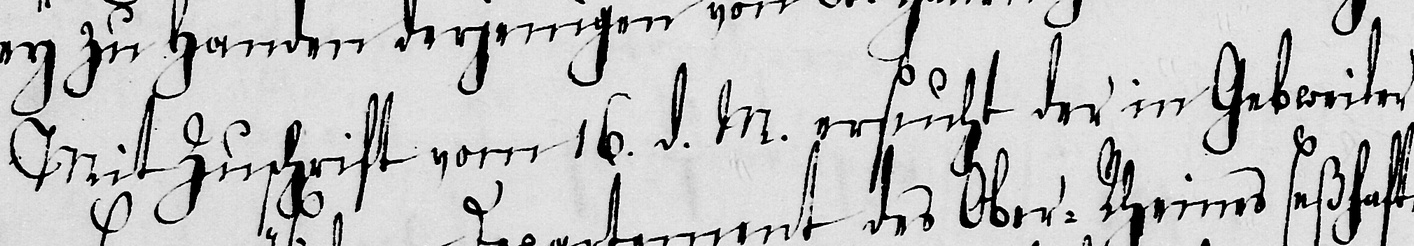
Mit Zuschrift vom 16. d. M. ersucht der in Gebweiler
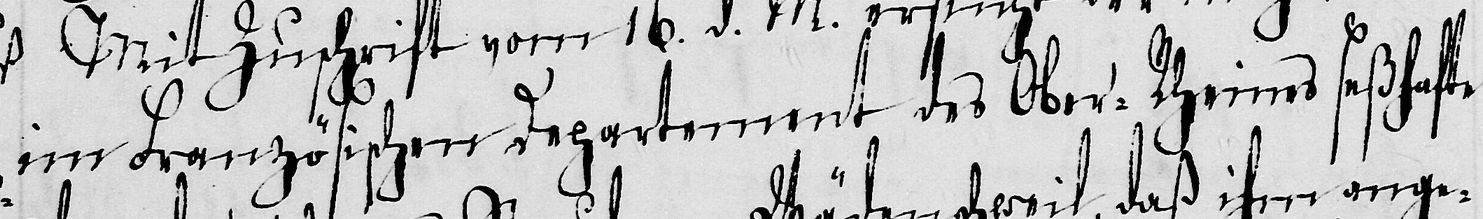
im Französischen Departement des Ober-Rheines seßhafte
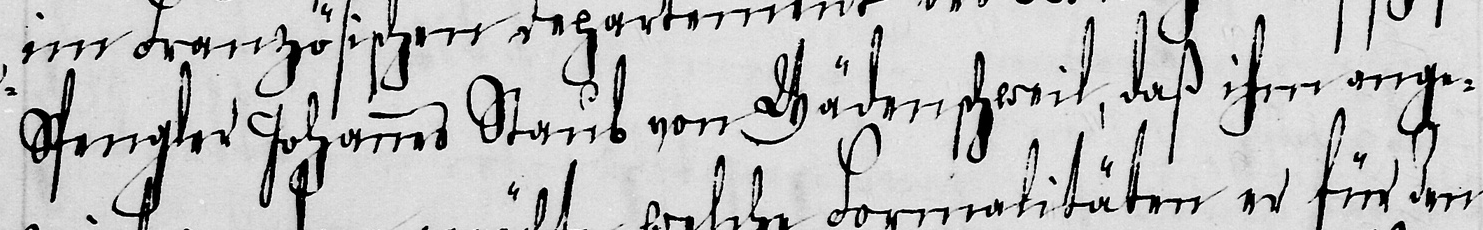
Spengler Johannes Staub von Wädenschweil, daß ihm ange¬
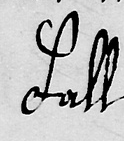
den
